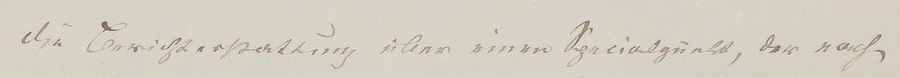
die Berichterstattung über einen Specialpunkt, der nach
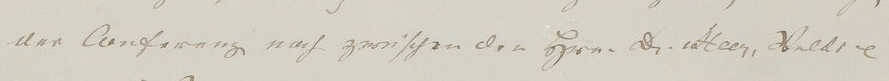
der Conferenz noch zwischen den Hrn. Heer, Welti u.
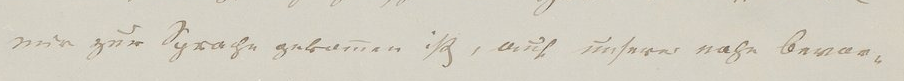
mir zur Sprache gekommen ist, auf unsere nahe bevor-
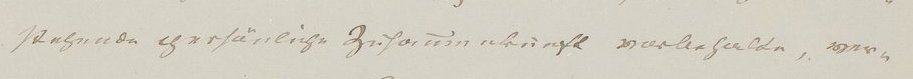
stehende persönliche Zusammenkunft vorbehalten, ver-
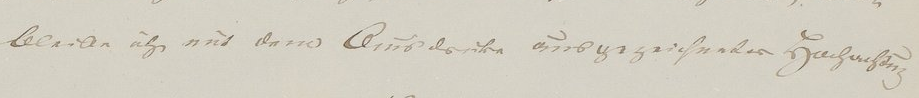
bliebe ich mit dem Ausdrucke ausgezeichneter Hochachtung.
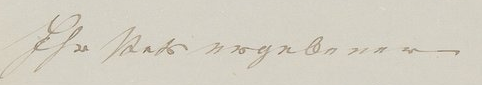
Ihr stets ergebener
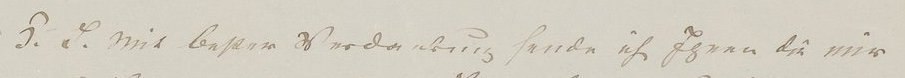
P. S. Mit bester Verdankung sende ich Ihnen die mir
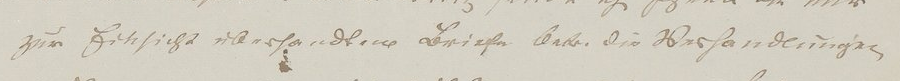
zur Einsicht übersandten Briefe betr. die Verhandlungen
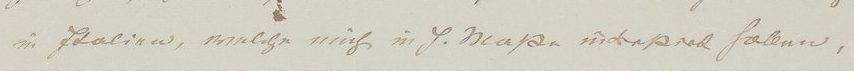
in Italien, welche mich in h. Maße intreßirt haben,
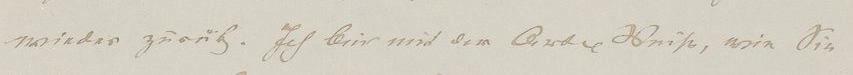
wieder zurück. Ich bin mit der Art u. Weise, wie Sie
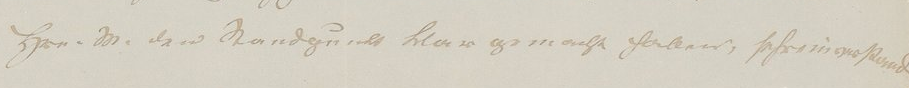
Hrn. M. den Standpunkt klar gemacht haben, sehr einverstanden.
